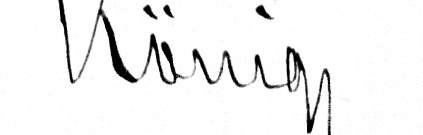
König
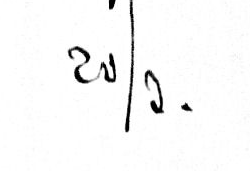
20/3.
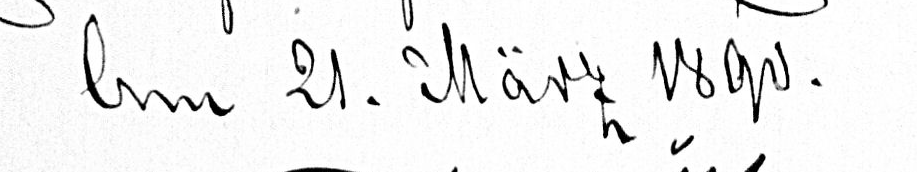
Am 21. März 1890.
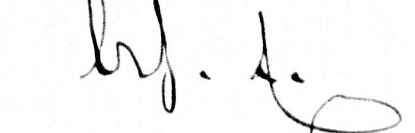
Ah. E.
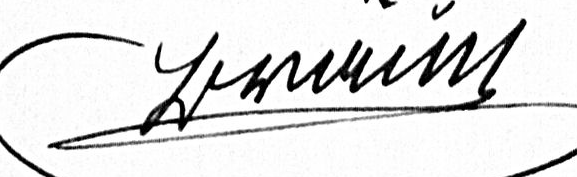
Braun
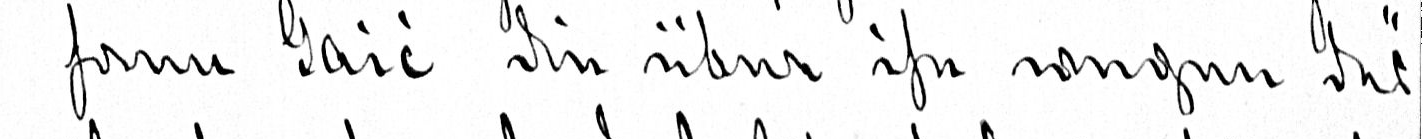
hann Gaić die über ihn wegen des
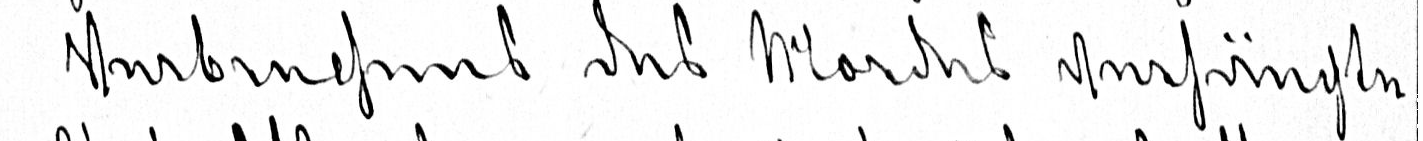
Verbrechens des Mordes verhängte
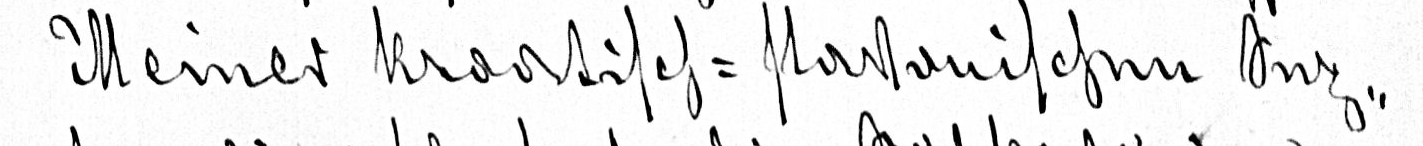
Meiner kroatisch-slavonischen Sep¬
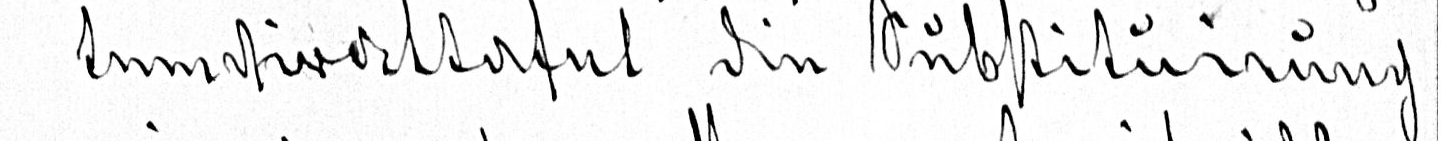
temviraltafel die Substituirung
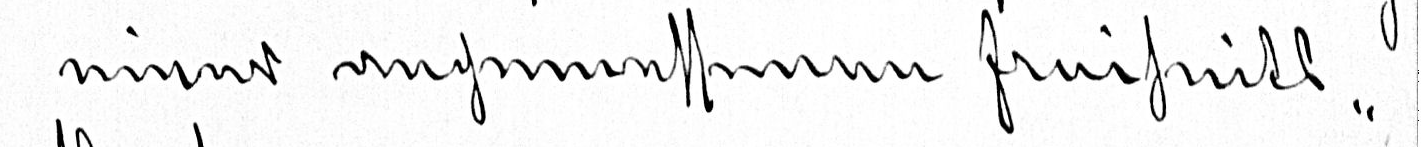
einer angemessenen Freiheits¬
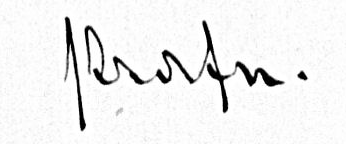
strafe.
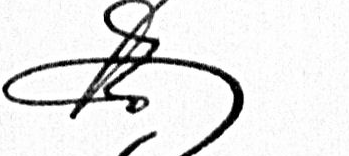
xx
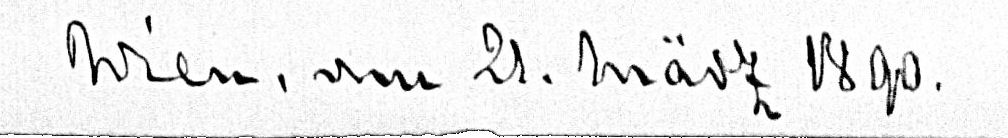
Wien, am 21. März 1890
